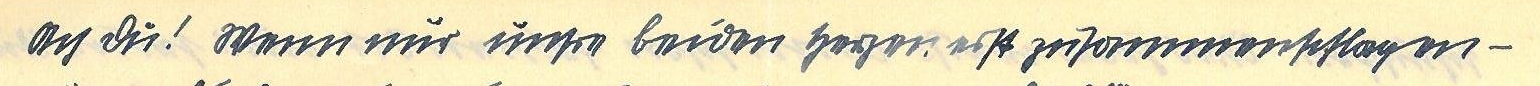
Ach Du! Wenn nur uns[e]re beiden Herzen erst zusammenschlagen –
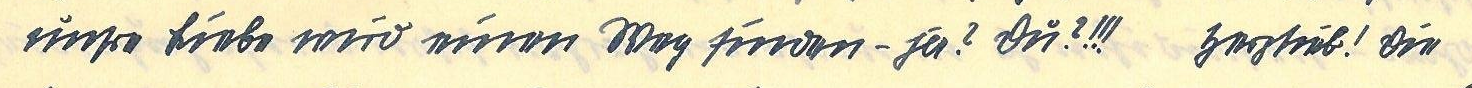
unsre Liebe wird einen Weg finden – ja? Du!!! Herzlieb! Die
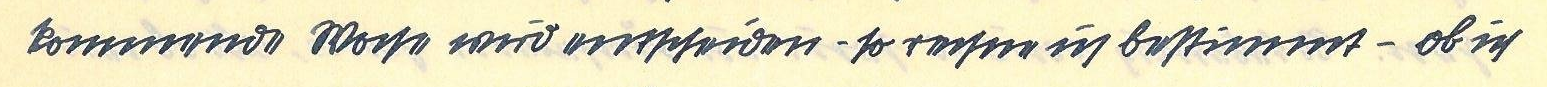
kommende Woche wird entscheiden – so rechne ich bestimmt – ob ich
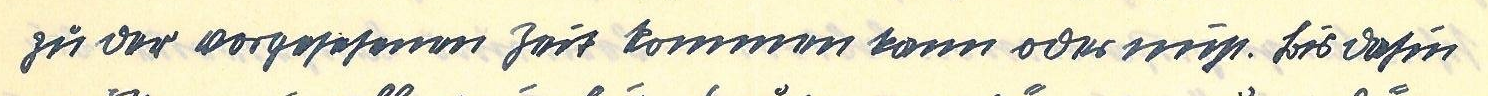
zu der vorgesehenen Zeit kommen kann oder nicht. Bis dahin
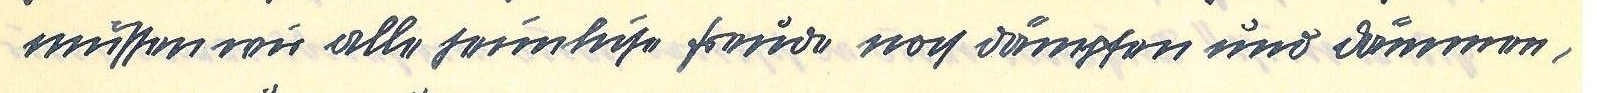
müssen wir alle heimliche Freude noch dämpfen und dämmen,
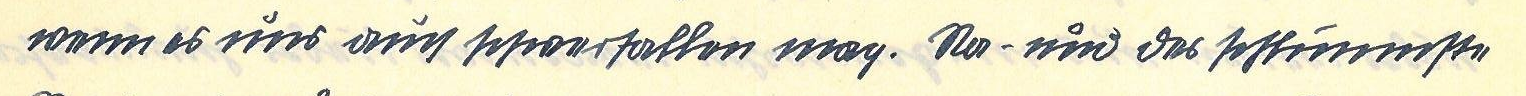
wenn es uns auch schwerfallen mag. Na – und der schlimmste
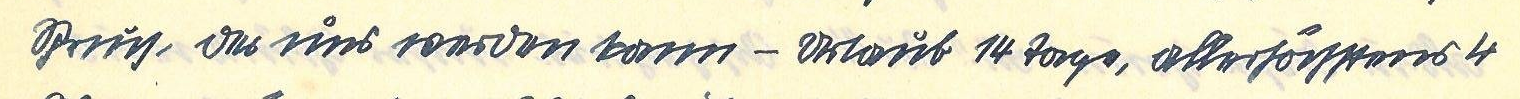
Spruch, der uns werden kann – Urlaub 14 Tage, allerhöchstens 4
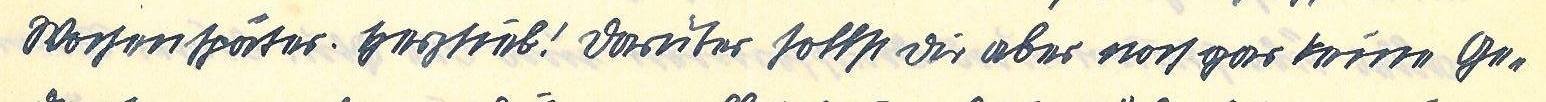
Wochen später. Herzlieb! Darüber sollst Dir aber noch gar keine Ge¬
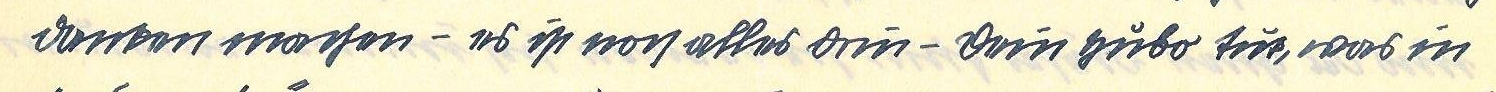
danken machen – es ist noch alles drin – Dein Hubo tut, was in
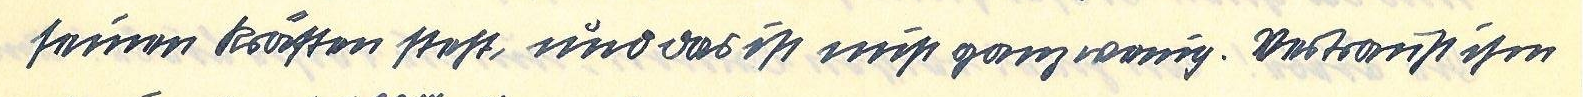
seinen Kräften steht, und das ist nicht ganz wenig. Vertraust ihm
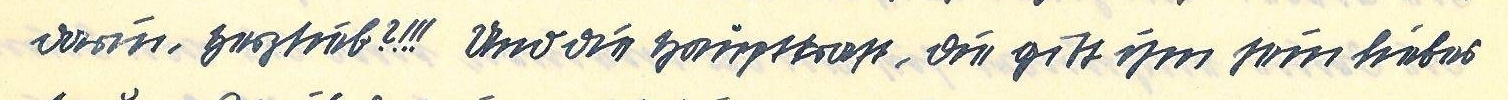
darin, Herzlieb?!!! Und die Hauptkraft, die gibt ihm sein liebes
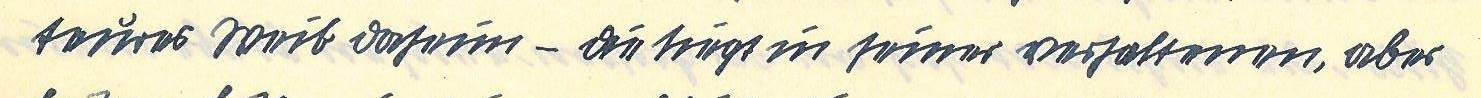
teures Weib daheim – die liegt in seiner verhaltenen, aber
